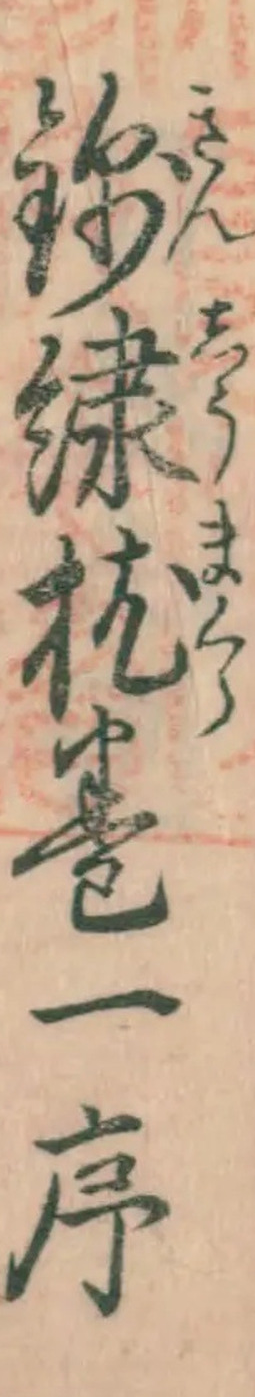錦繍枕巻一序
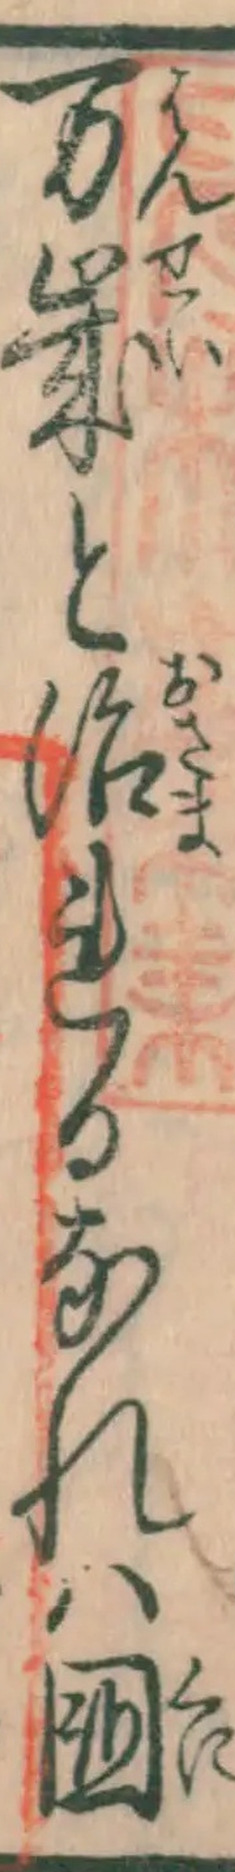万歳と治れるなれは国
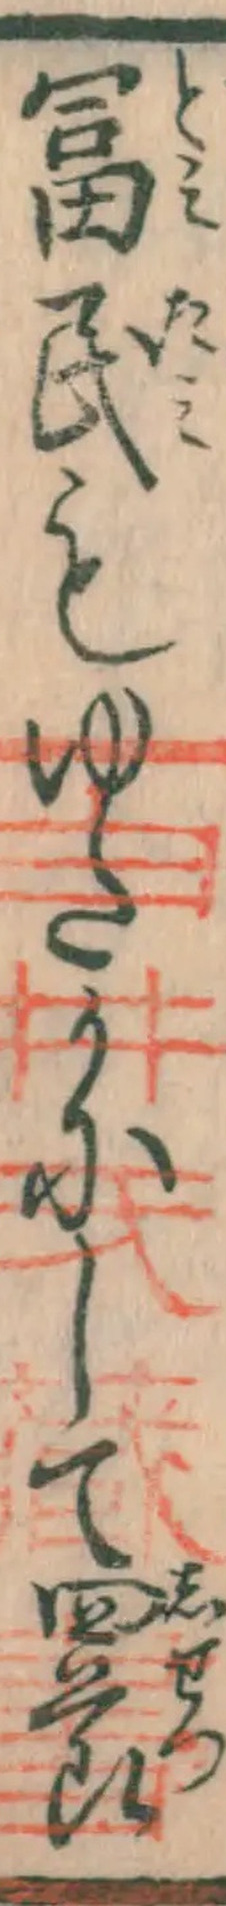冨民もゆたかにして四節
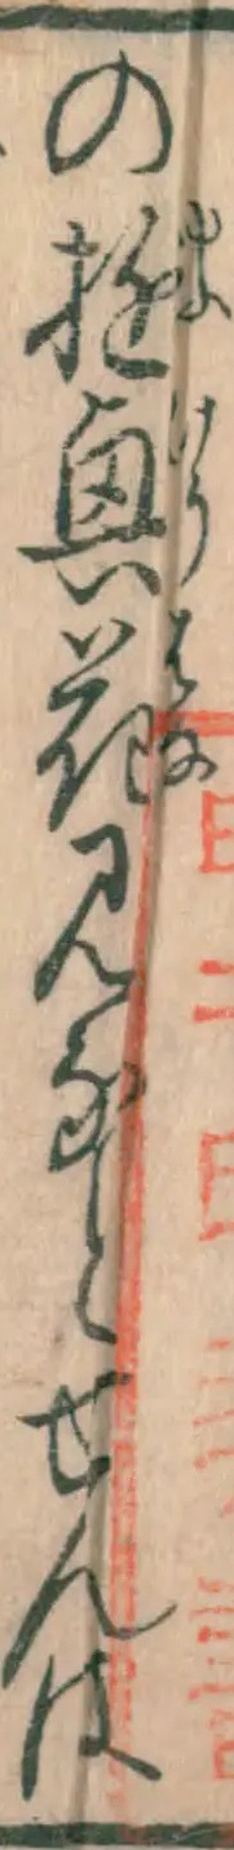の遊興花見なとせんは
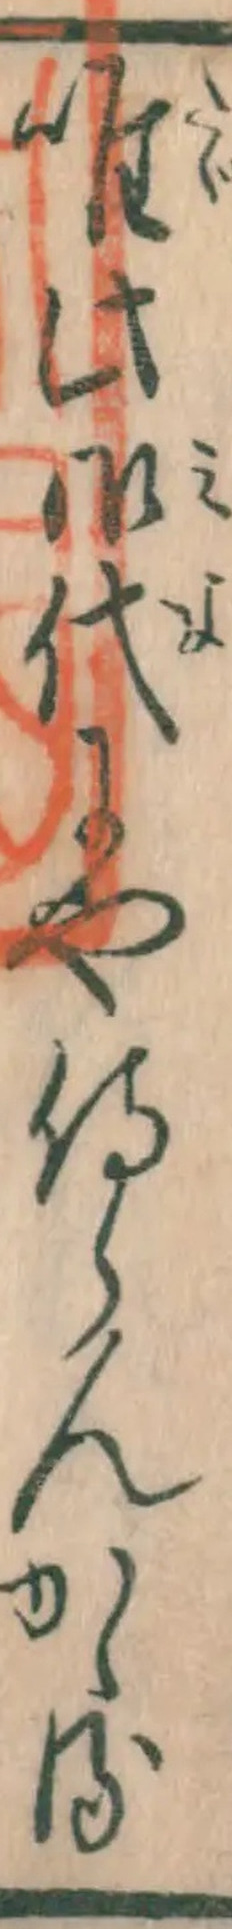唯此御代にや侍らんかゝる
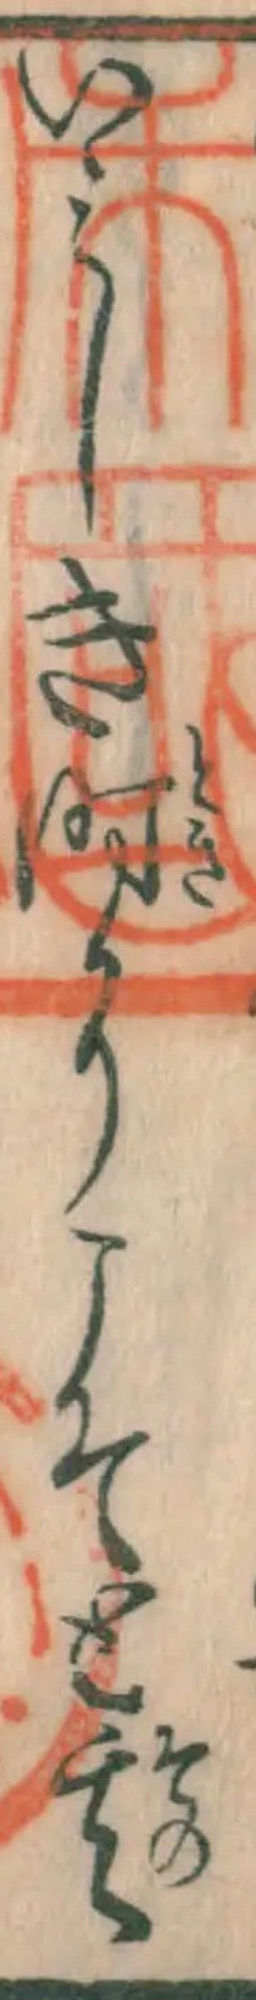いみしき時にこそと其
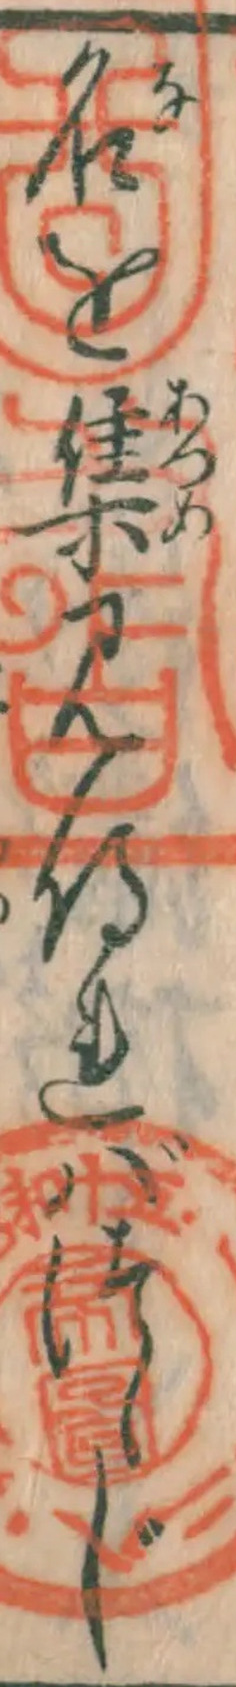名を集見侍ればつゝじ
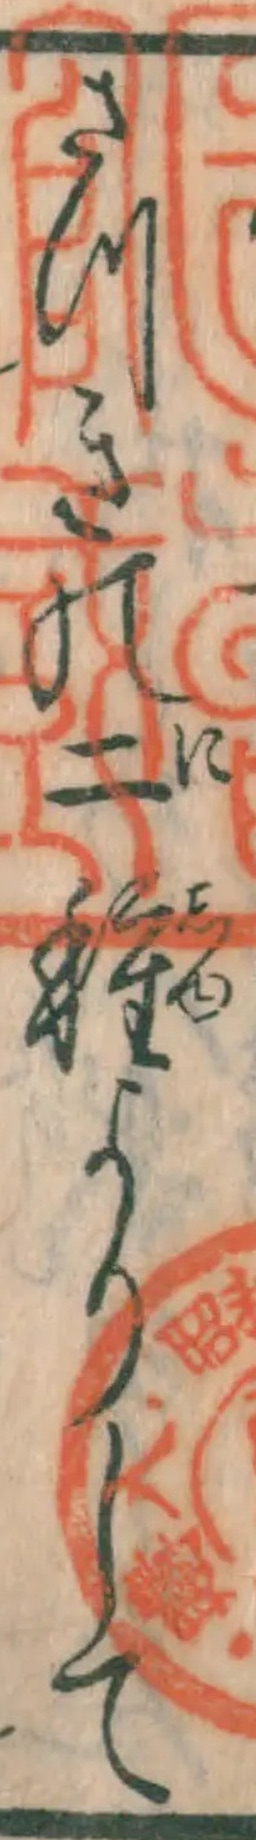さつきの二種よりして
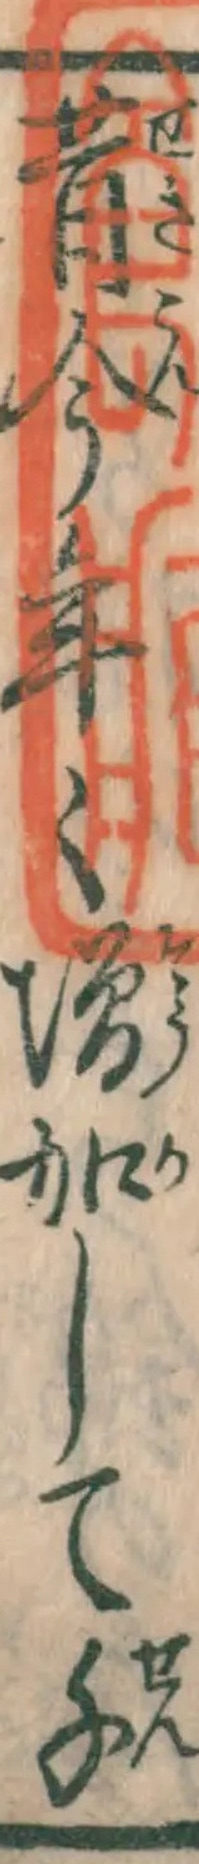昔今年々増加して千
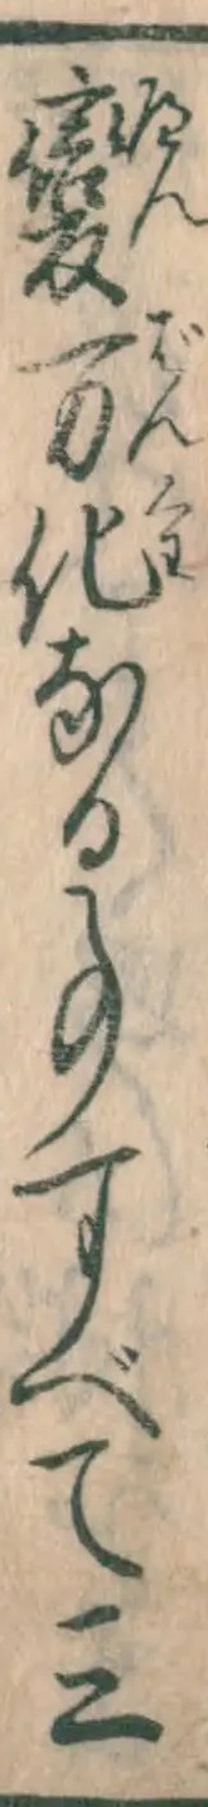變万化なる事すべて三
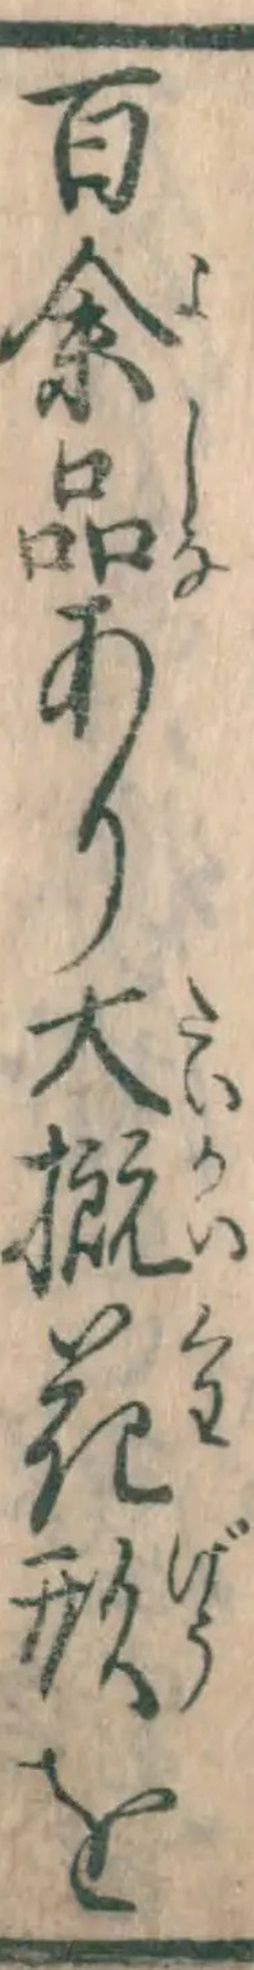百余品あり大概花形を
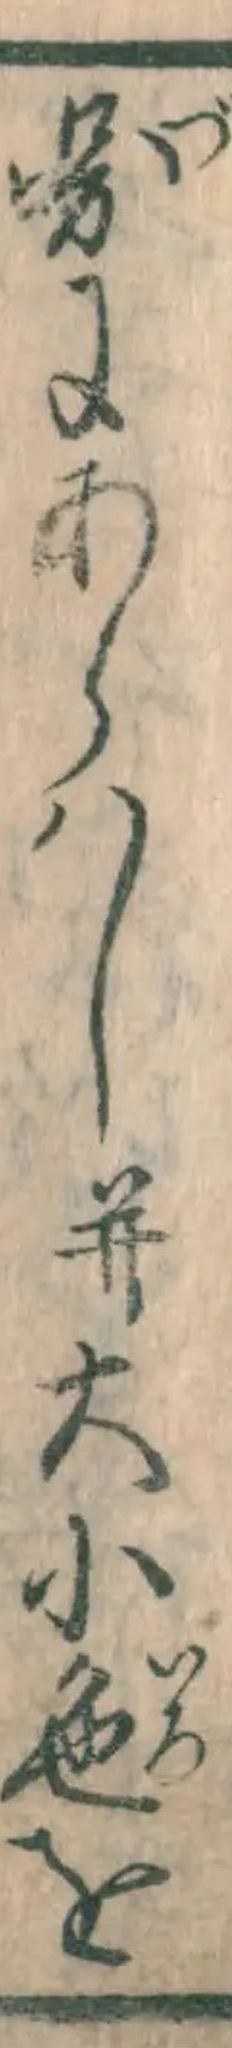図にあらはし并大小色を
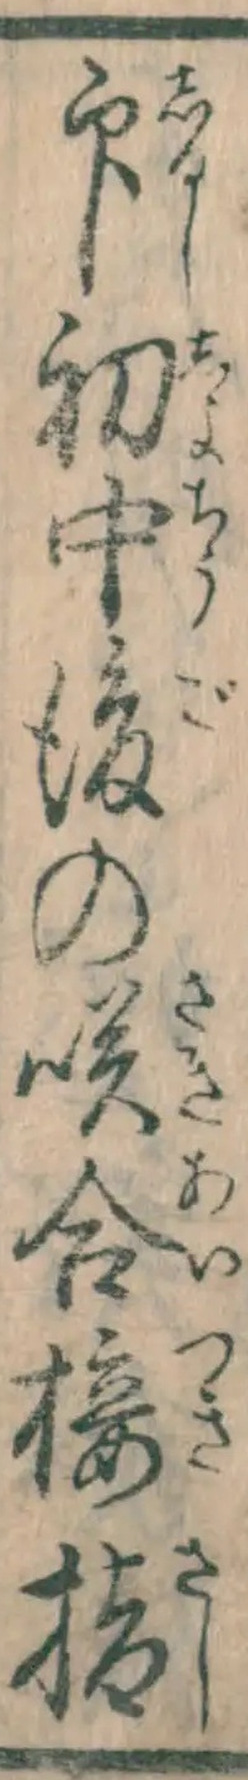印初中後の咲合接指

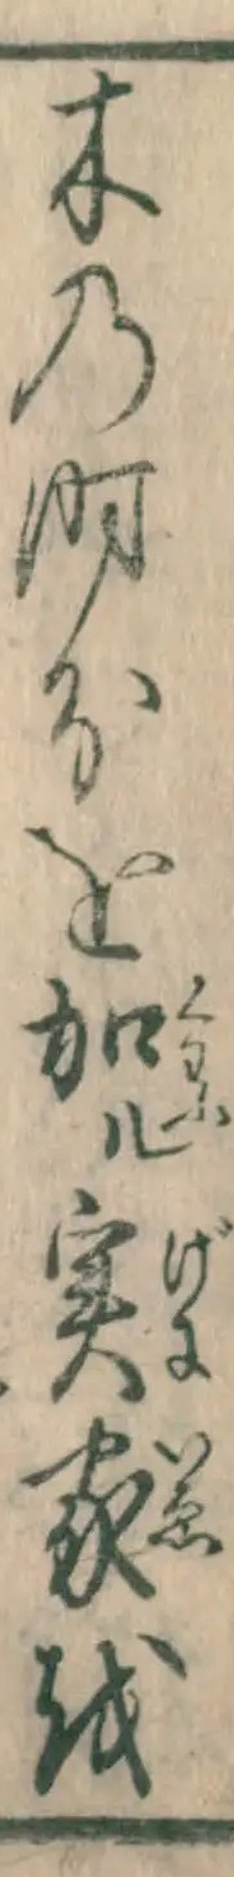木の時分を加る実家を
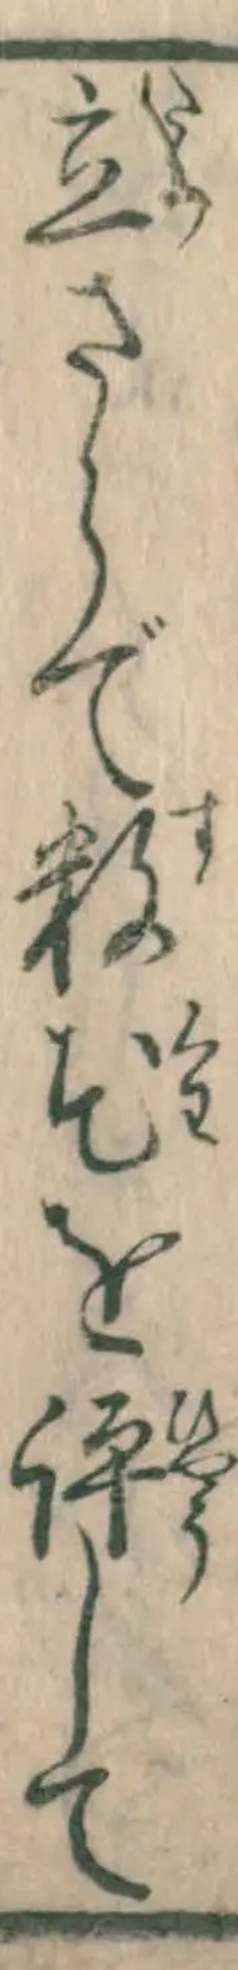立さらで数花を評して
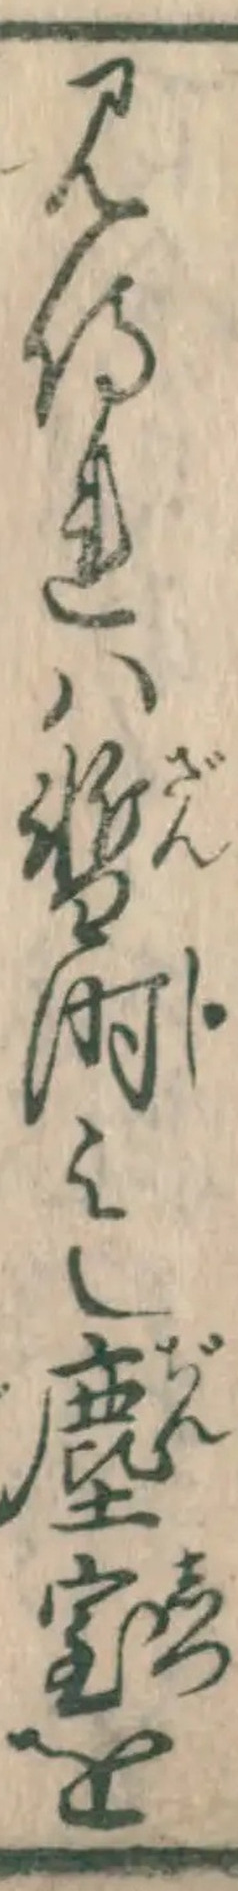見侍れば暫時よし塵室を
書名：錦繍枕 5巻. [1]
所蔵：国立国会図書館 National Diet Library, JAPAN
